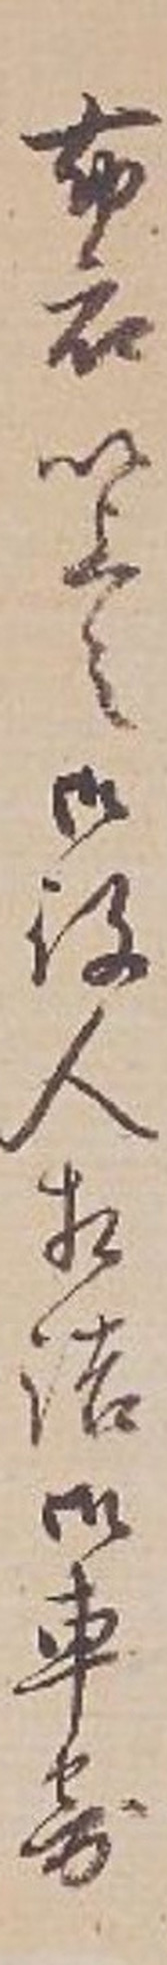布衣以上御役人相詰御車寄
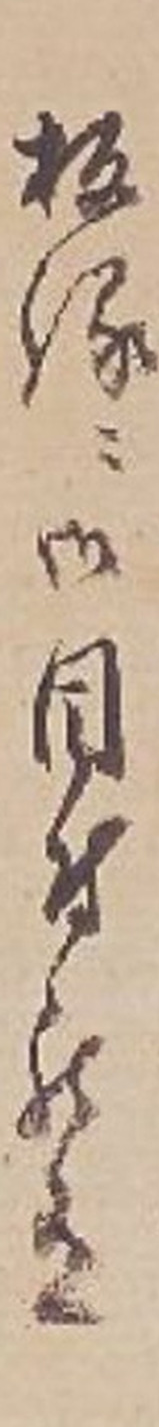板縁に御目付罷有
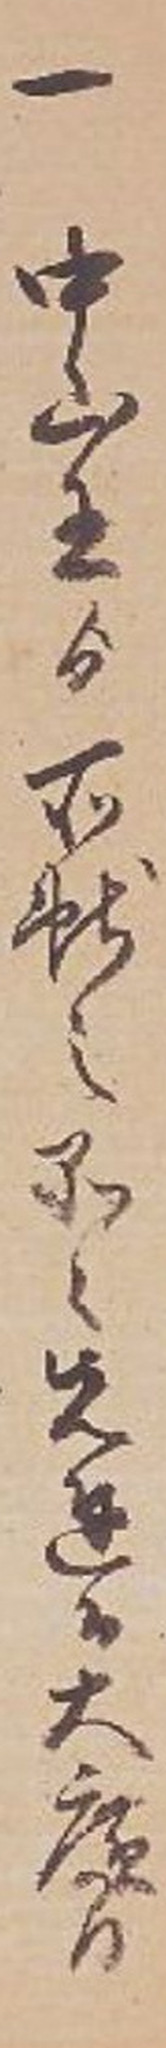一中山王ゟ所献之品々先達而大広間
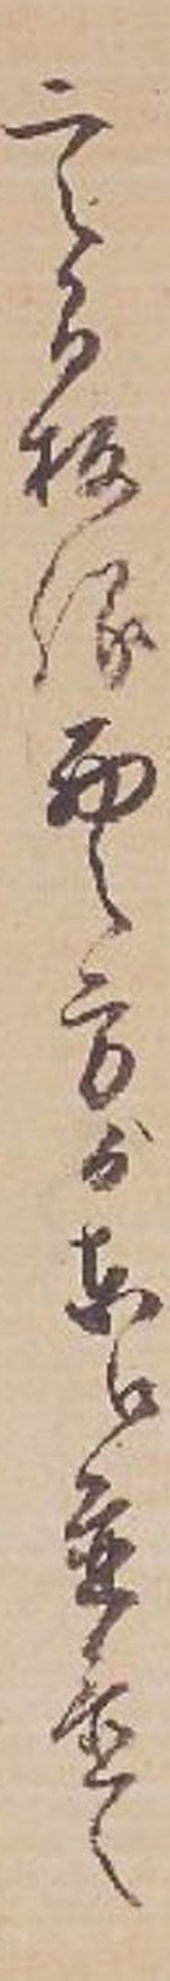二之間板縁西之方ゟ東え並置之
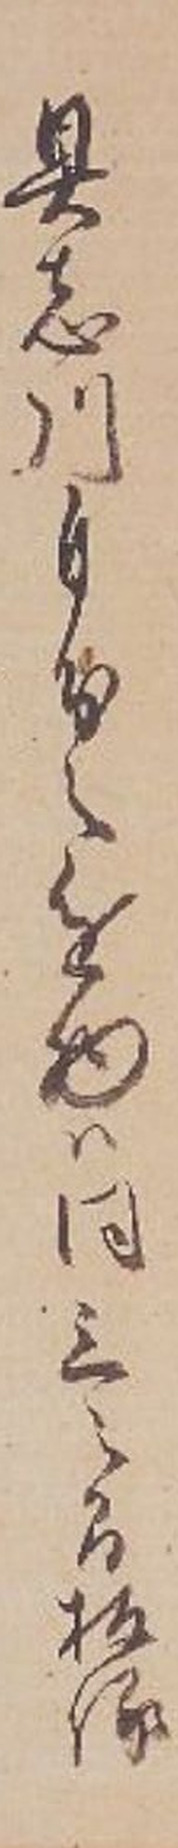具志川自分之進物は同三之間板縁
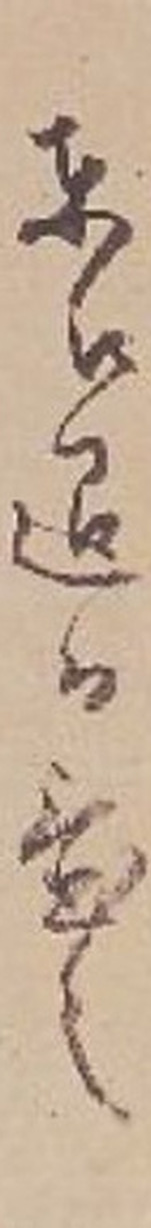東え退而置之
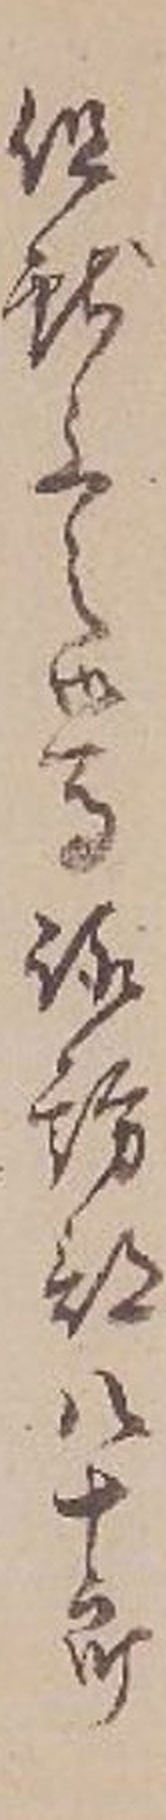但献上之御馬諏訪部八十郎
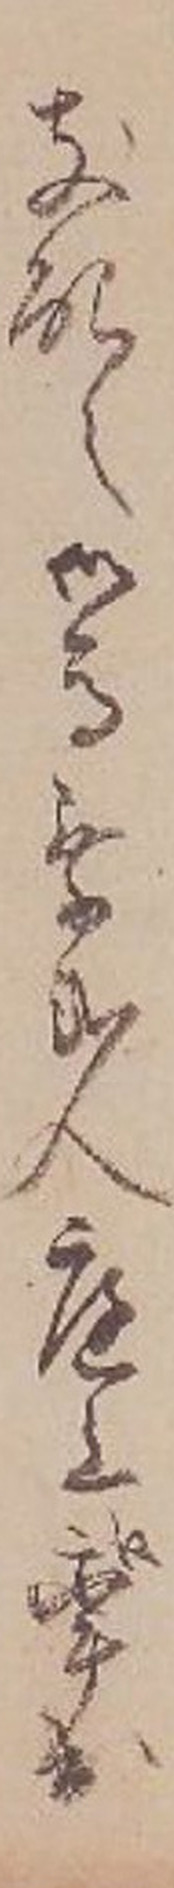支配之御馬乗弐人庭上え牽出

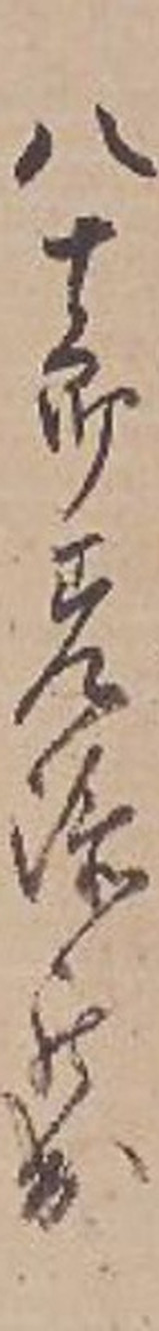八十郎差添罷出
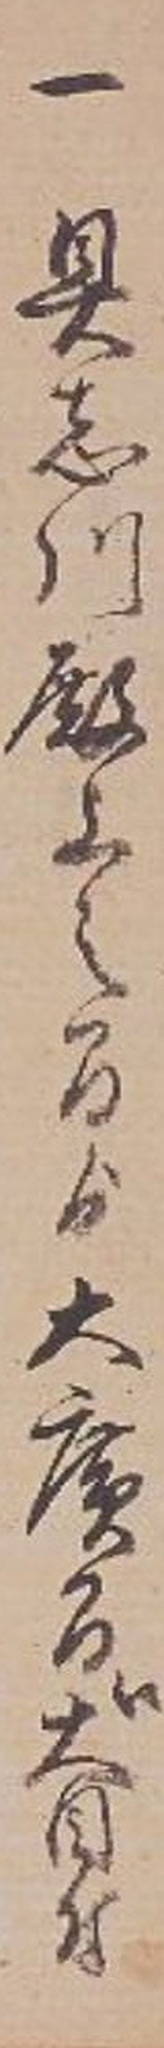一具志川殿上之間ゟ大広間え大目付
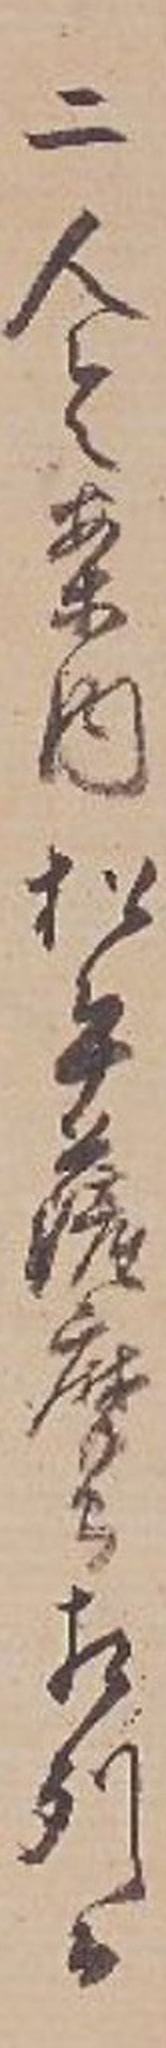二人先案内松平薩摩守相列而
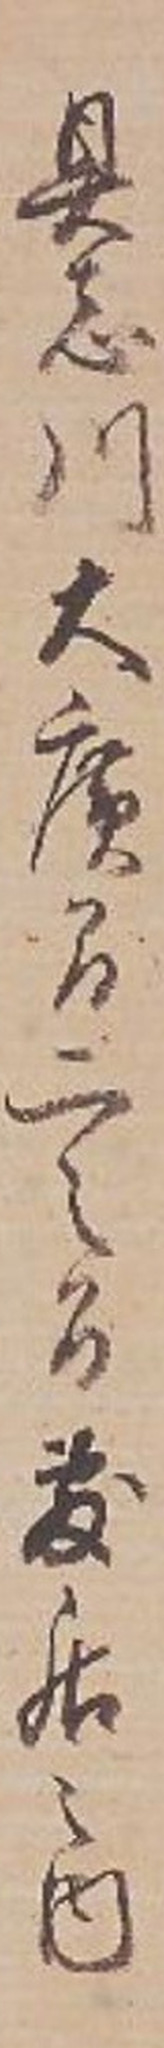具志川大広間二之間敷居之内
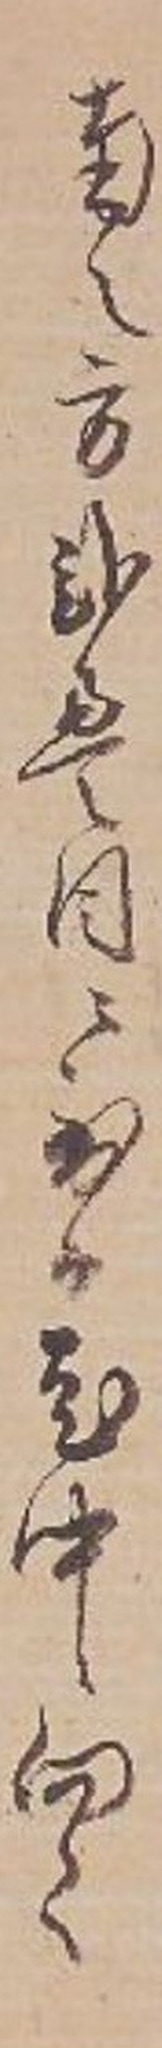南之方弐畳目に到而老中に向て
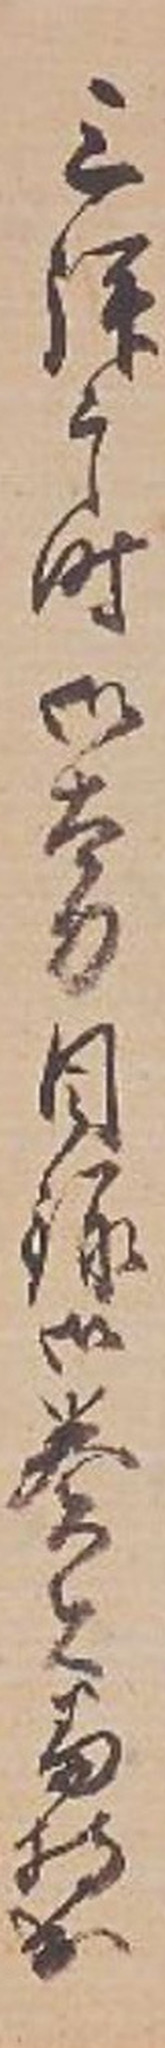三拝其時御太刀目録御奏者番持出
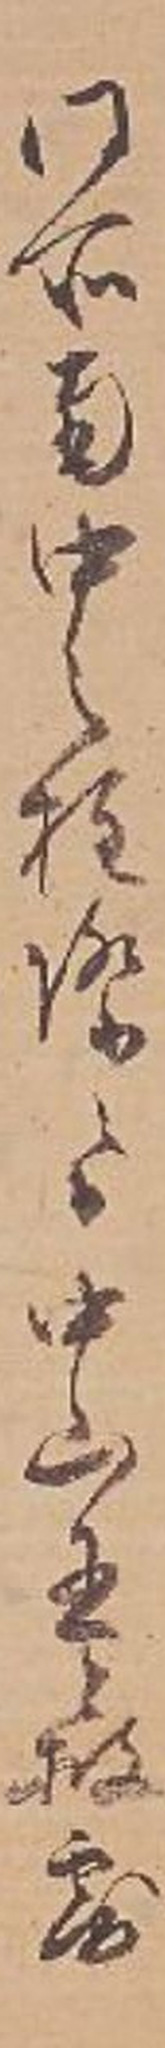同所南中之柱際に而中山王と披露
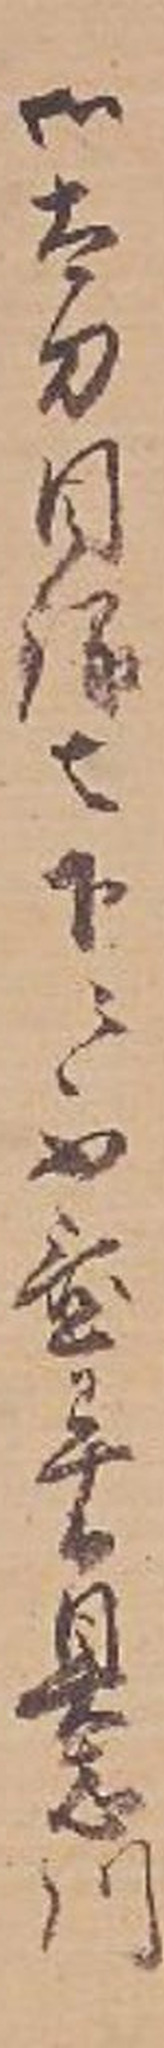御太刀目録は下に不置畢而具志川
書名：琉球人来朝記 五、六、七
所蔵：University of the Ryukyus Library
